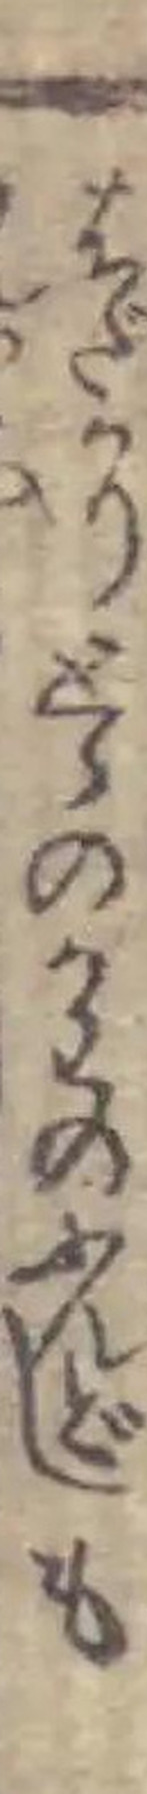はだかりとらのかわのふんどしも
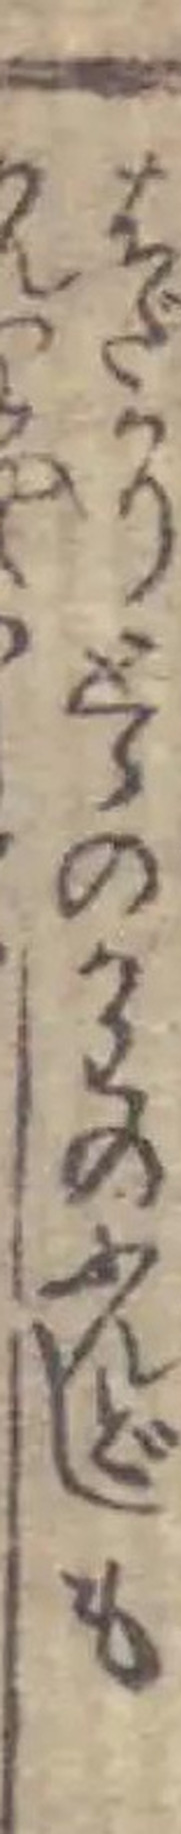はだかりとらのかわのふんどしも
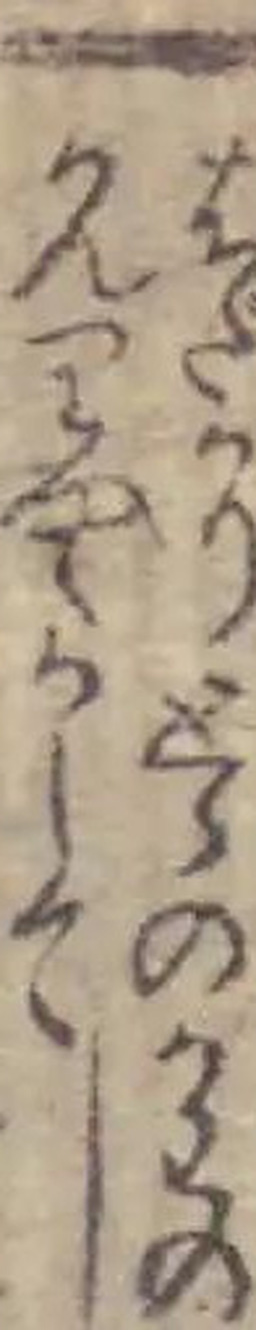かんりやくかして
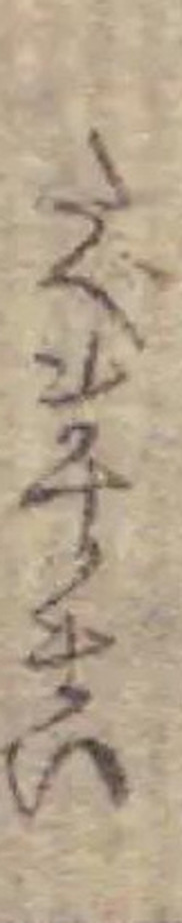たべますまい
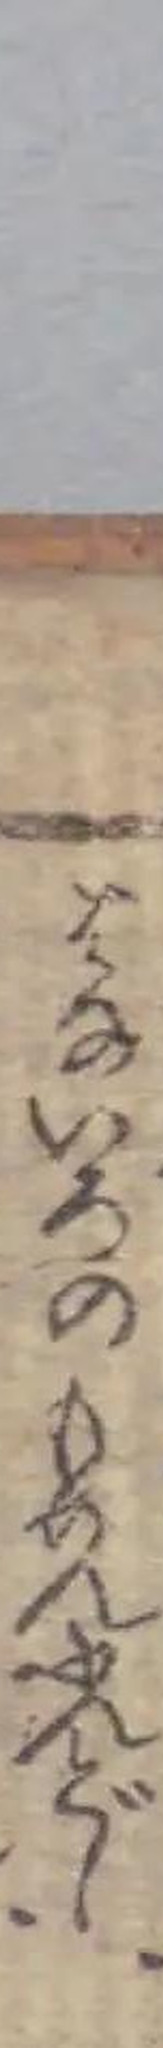はないろのもめんふんどし
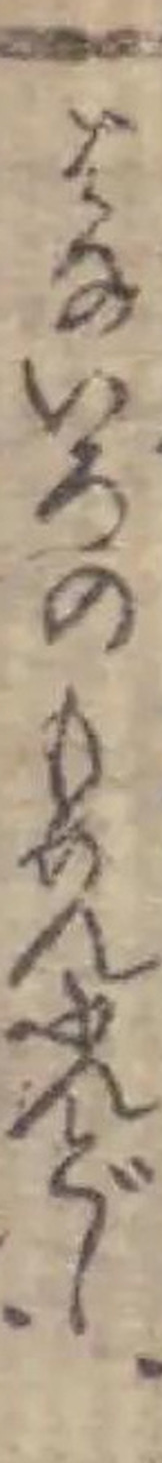はないろのもめんふんどし
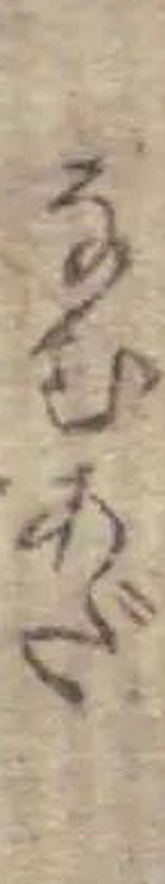なむあだ
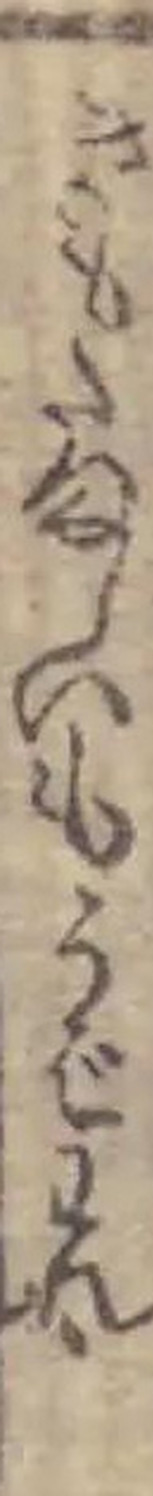きもたましいもうばわれ
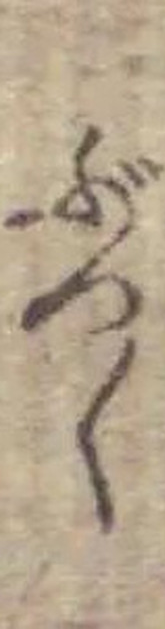ぶつ〳〵
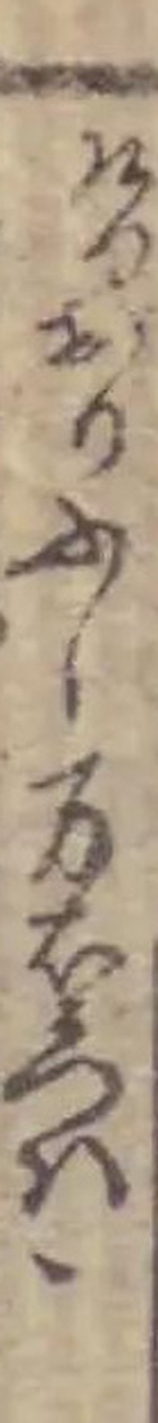けるおりふし万右衛門は
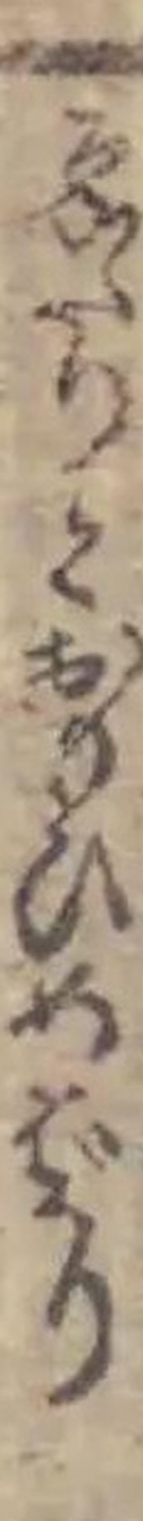ゑたりとおもひめばり
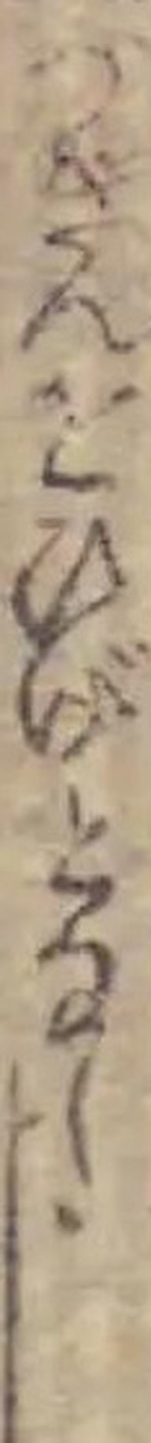づきんをひげとなし
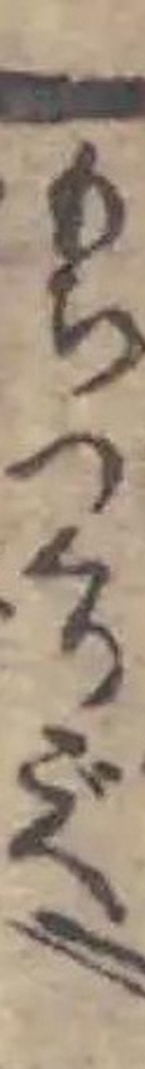もちつくりごへ
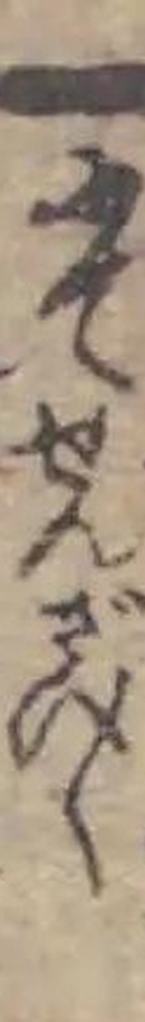にてぜんざい〳〵
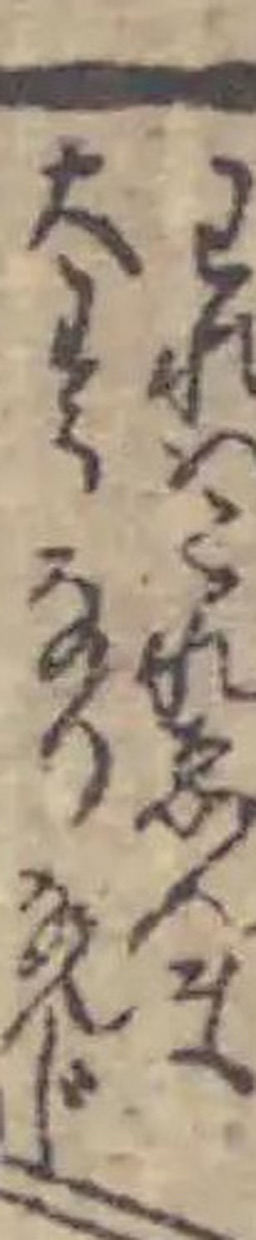大わうなりなんじ
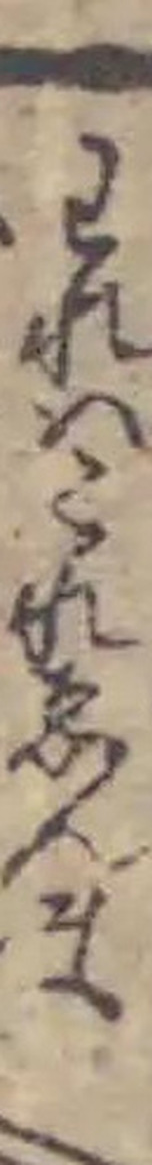われはこれゑんま
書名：飲中八人前 3巻
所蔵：国立国会図書館 National Diet Library, JAPAN
